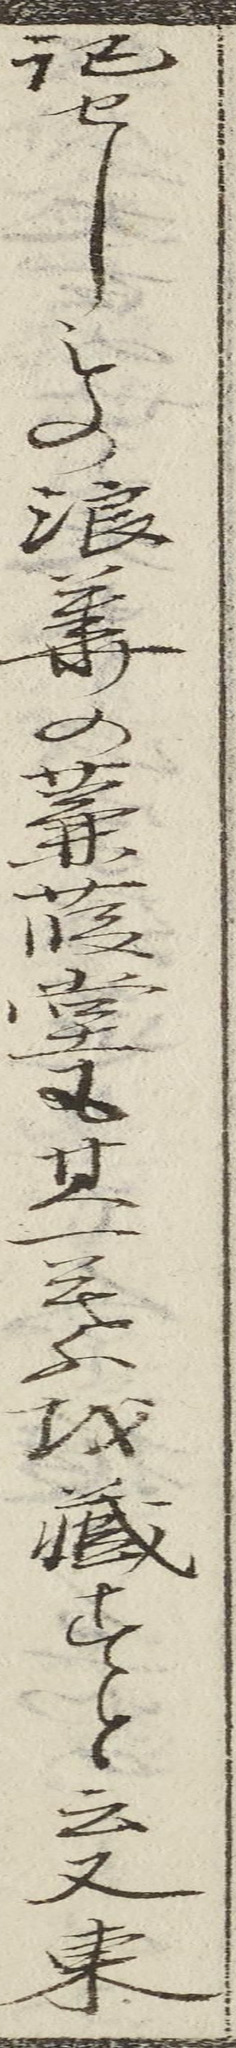記せしもの浪美の蒹葭堂も其一葉を蔵すと云又東
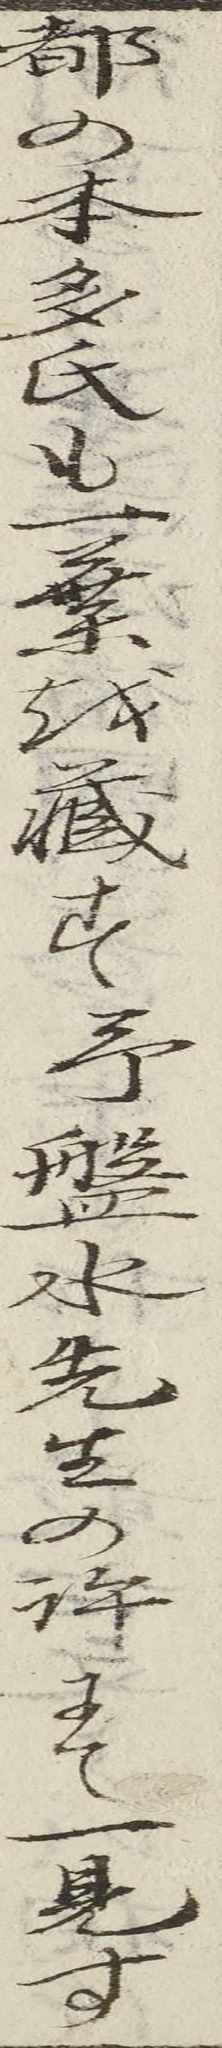都の本多氏も一葉を蔵す予盤水先生の許にて一見す
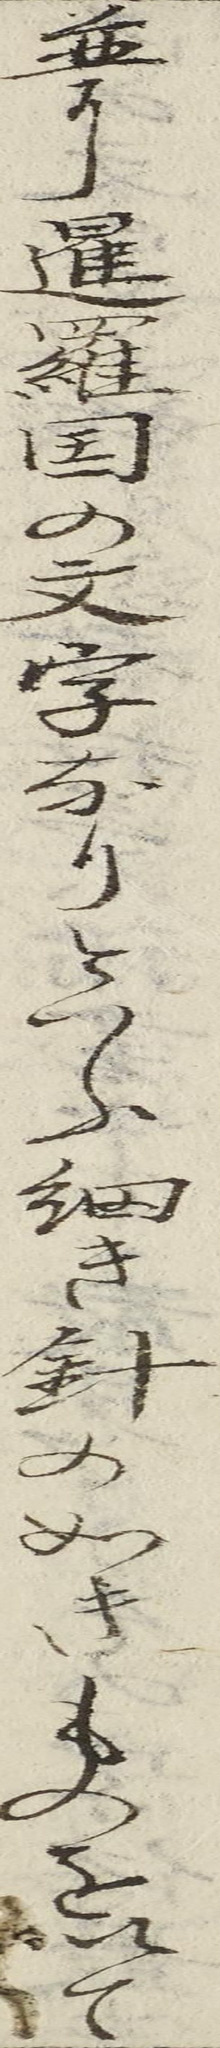並に暹羅国の文字なりといふ細き針の如きものを以て
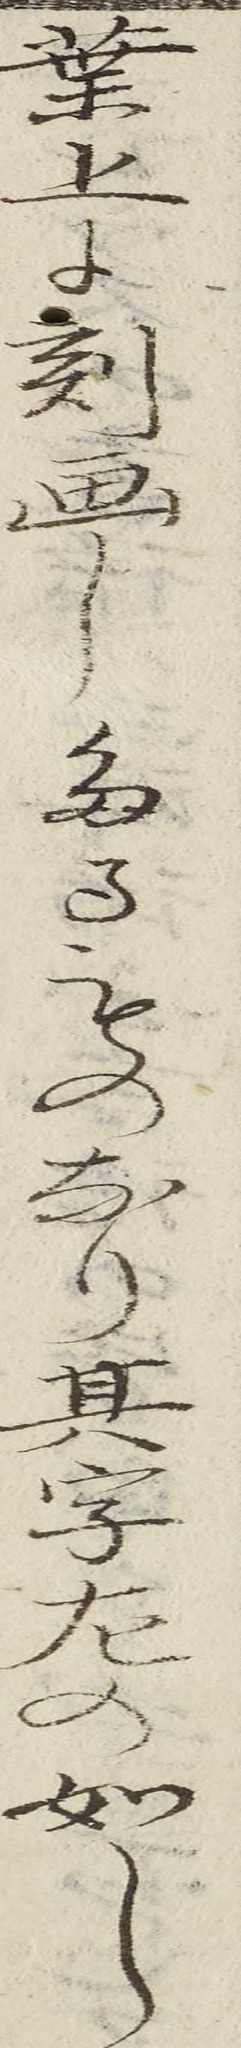葉上に刻画したるものなり其字左の如し

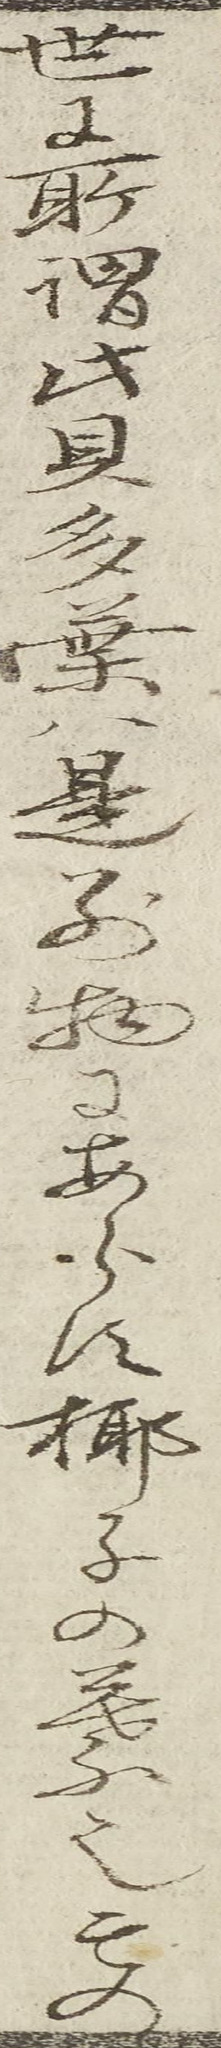世に所謂此の具多葉は是別物にあらす椰子の葉也その
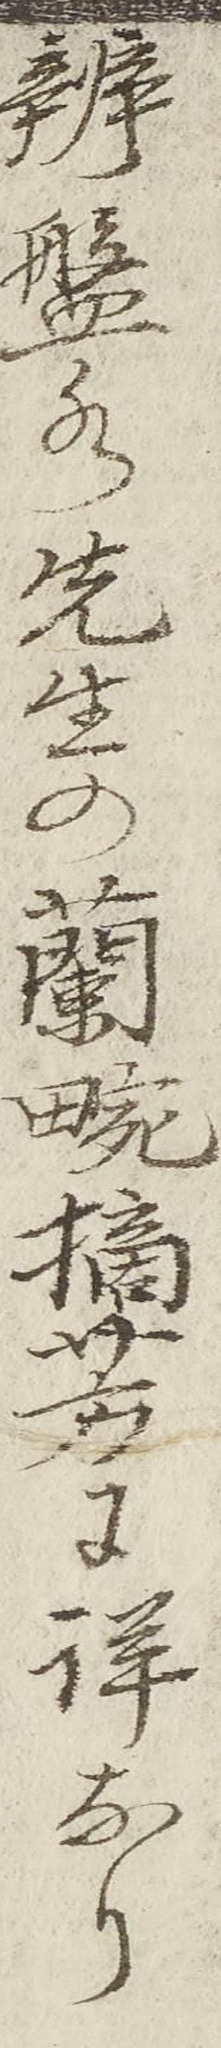辨盤水先生の蘭畹摘芳に詳なり
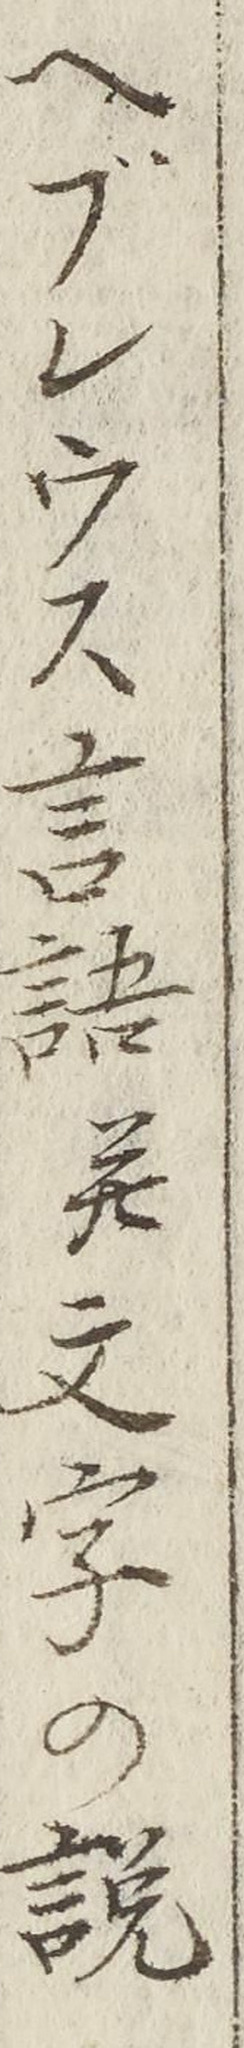へブレウス言語并文字の説
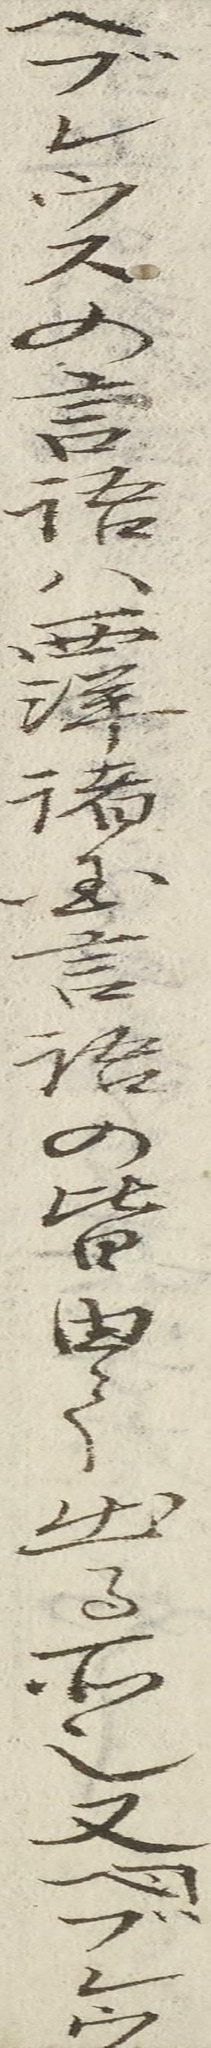へブレウスの言語ハ西洋諸国言語の皆由て出る所也又「へブレウ
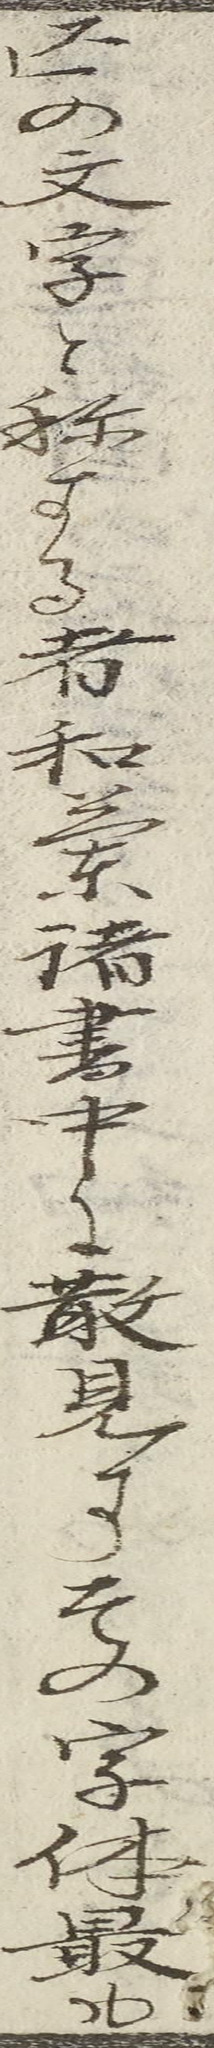ス」の文字と称する者和蘭諸事中に散見すその字体最も
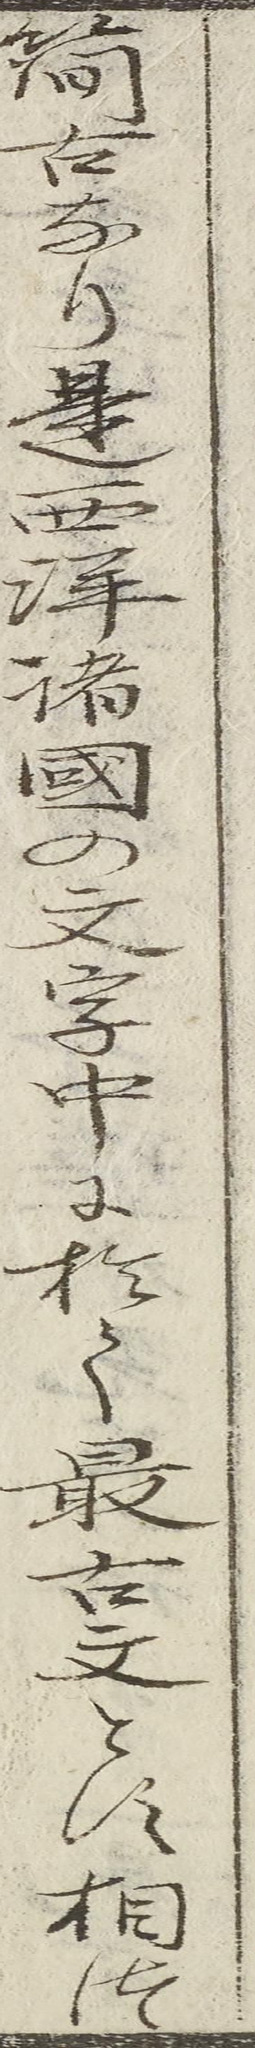簡古なり是西洋諸国の文字中に於て最古とす相つ
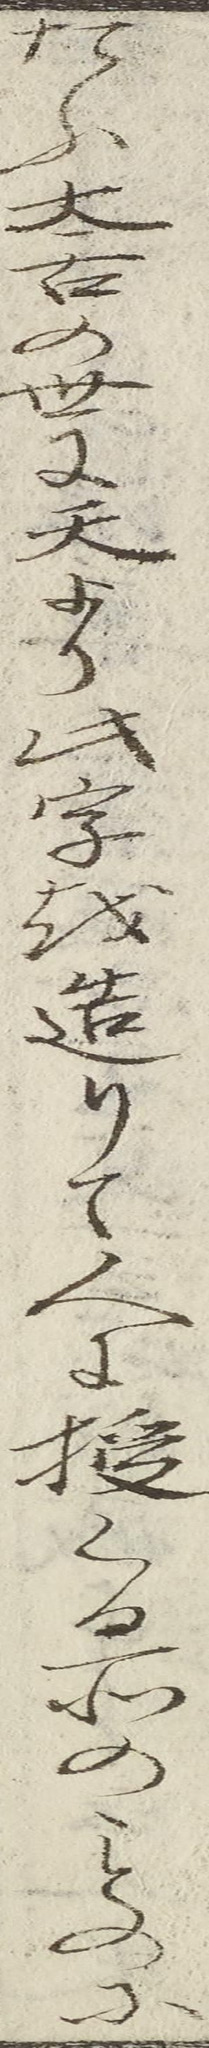たふ太古の世に天より此字を造りて人に授くる所のものに
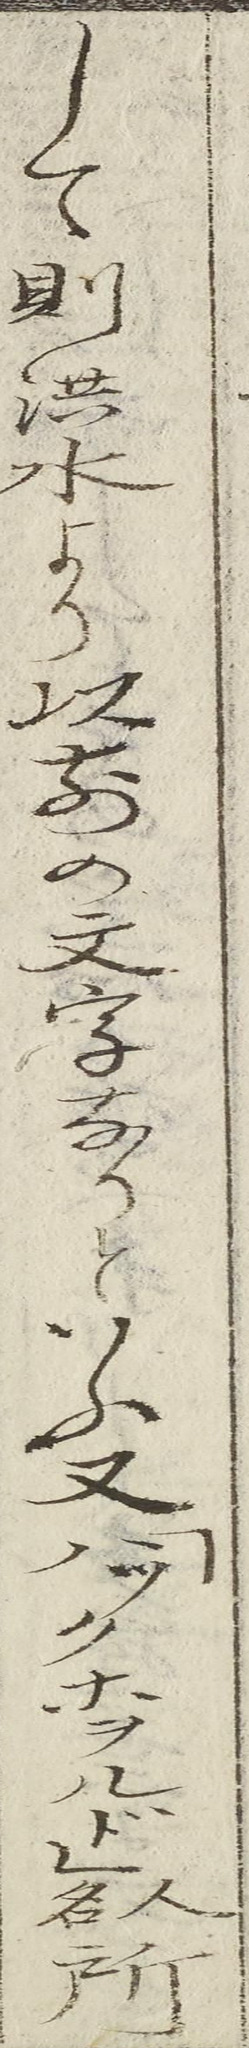して則洪水より以前の文字といふ又「ハックホヲルド」人名
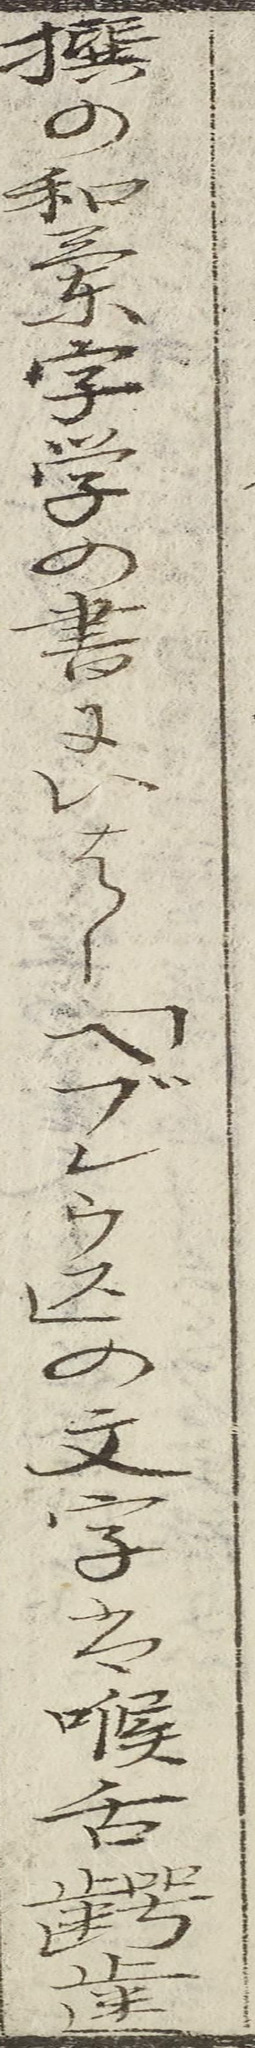所撰の和蘭字学の書にいはる「へブレウス」の文字は喉舌齶歯
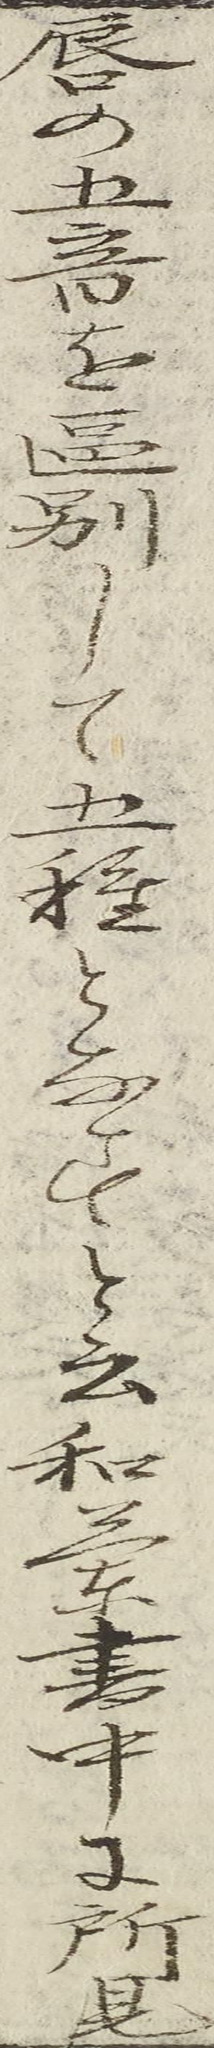唇の五音を区別して五程となすと云和蘭書中に所見
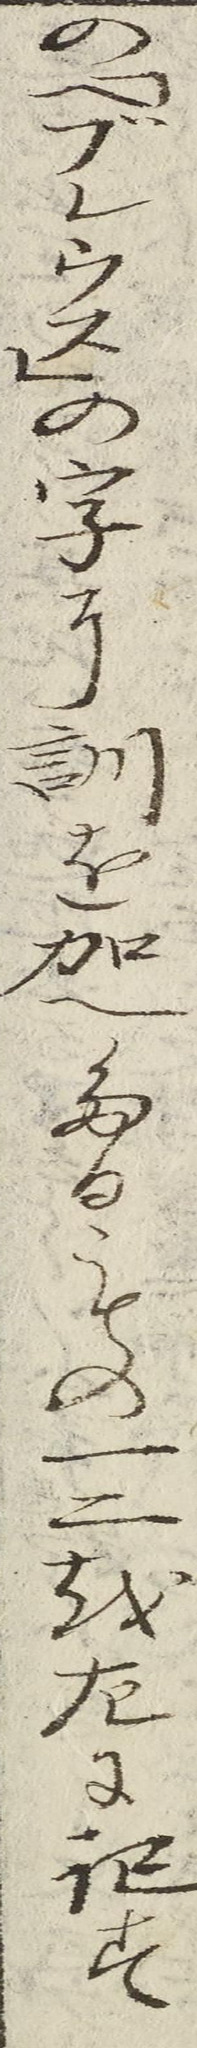の「へブレウス」の字に訓を加へたるもの一二を左に記す
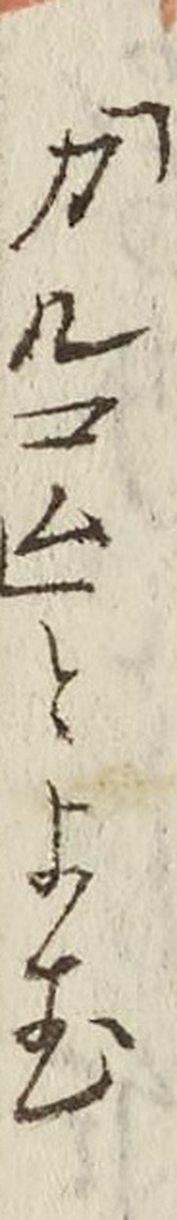「カルコム」とよむ
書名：西洋雜記　坤
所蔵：東京大学地震研究所図書室 Earthquake Research Institute Library, The University of Tokyo, JAPAN
